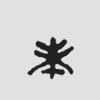未
